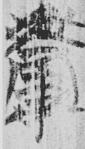𨍱（乘）
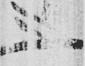之
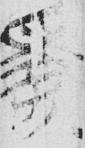○（家）
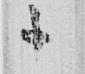十
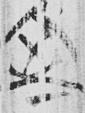室
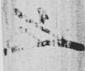之
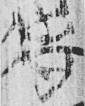○（俈）
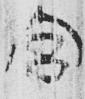宮
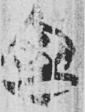室
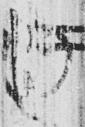汙
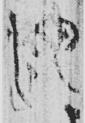池
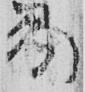各
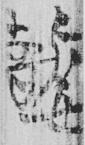○（慎）
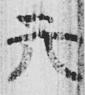亓
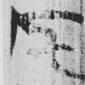厇（度）
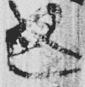母
